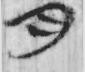月
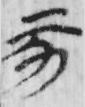亥
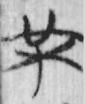某
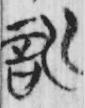訓（順）
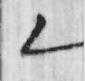乙
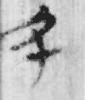丑
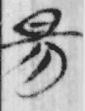昜（陽）
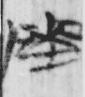陵
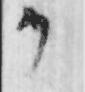人
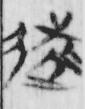遠
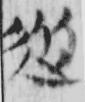從
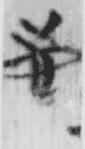志
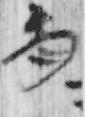十月
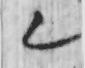乙
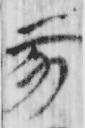亥
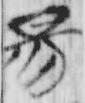昜（陽）
